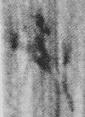又（有）
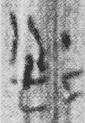○（過）
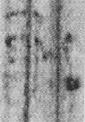○（信）
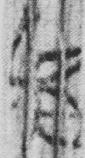矣
